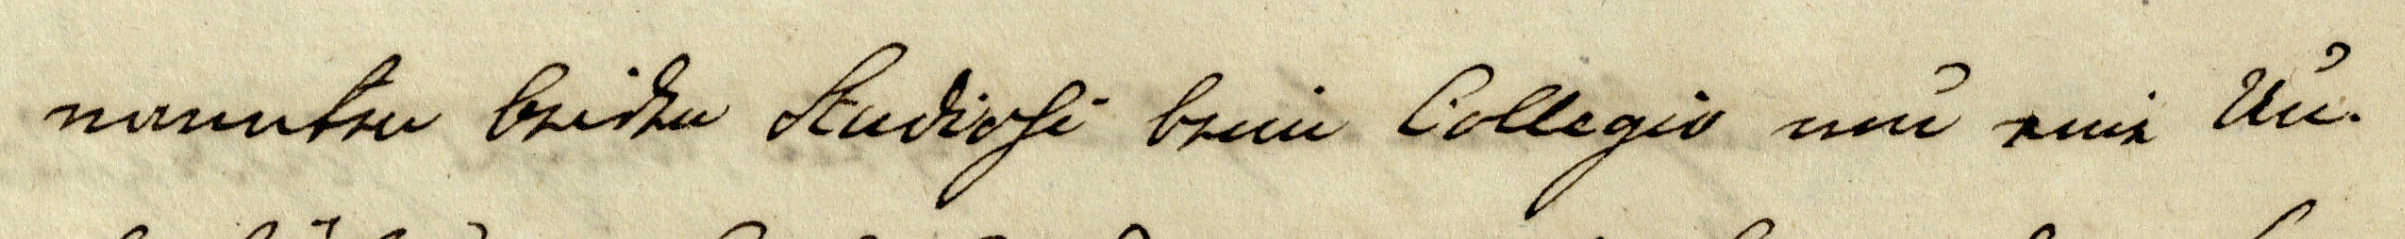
nannten beiden Studiosi beim Collegio um eine Un¬
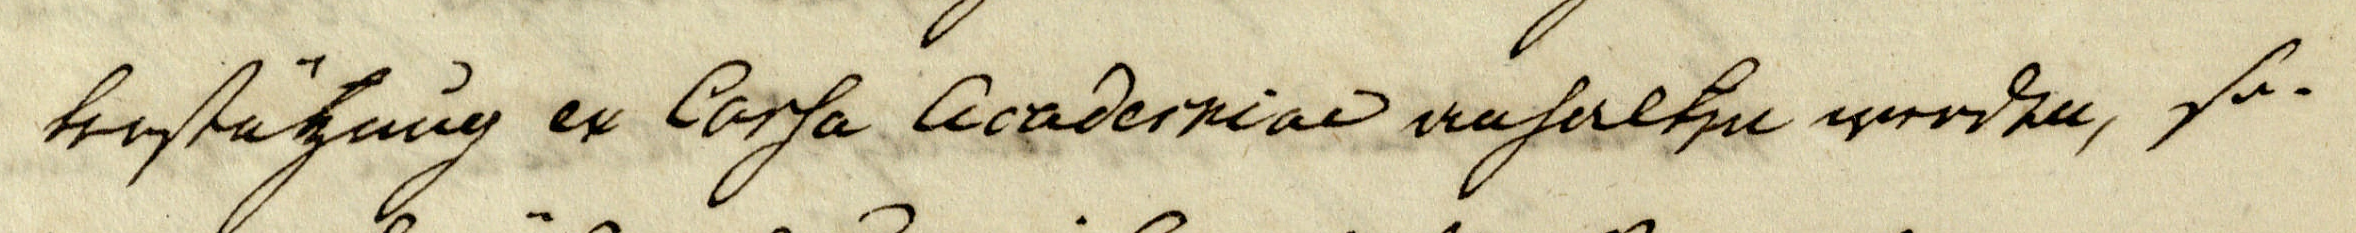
terstützung ex Cassa Academiae anhalten werden, so¬
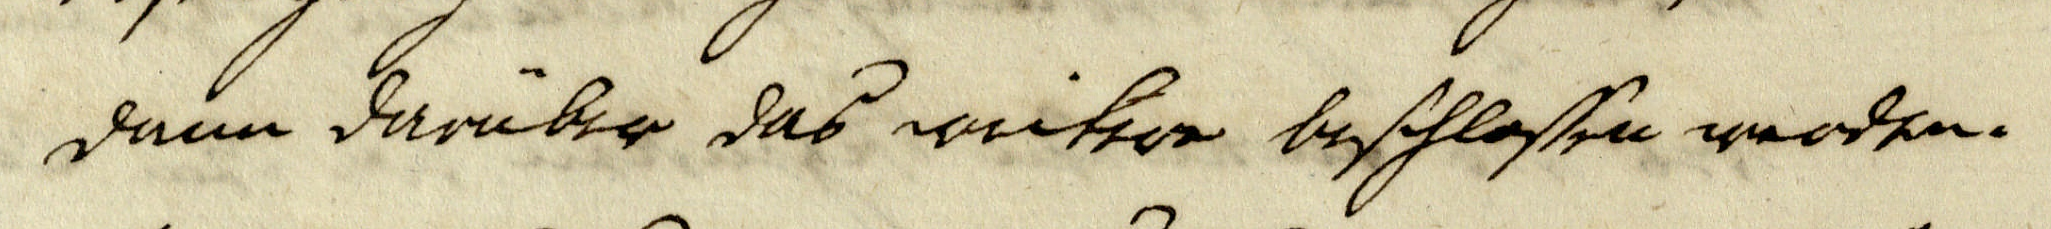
dann darüber das weitere beschlossen werden.
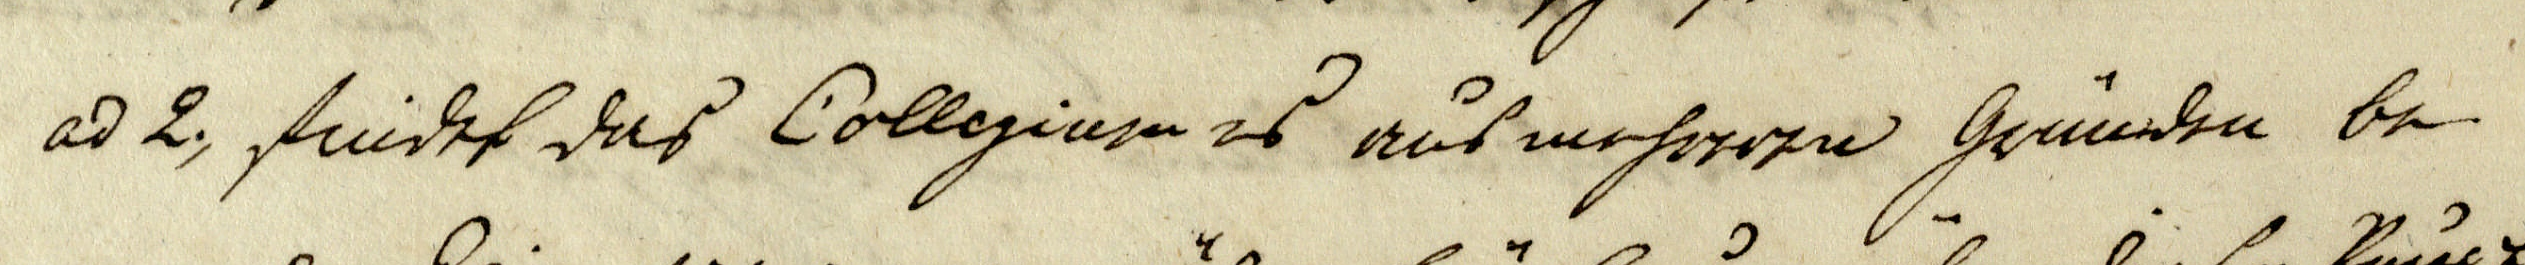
ad 2., findet das Collegium es aus mehreren Gründen be¬
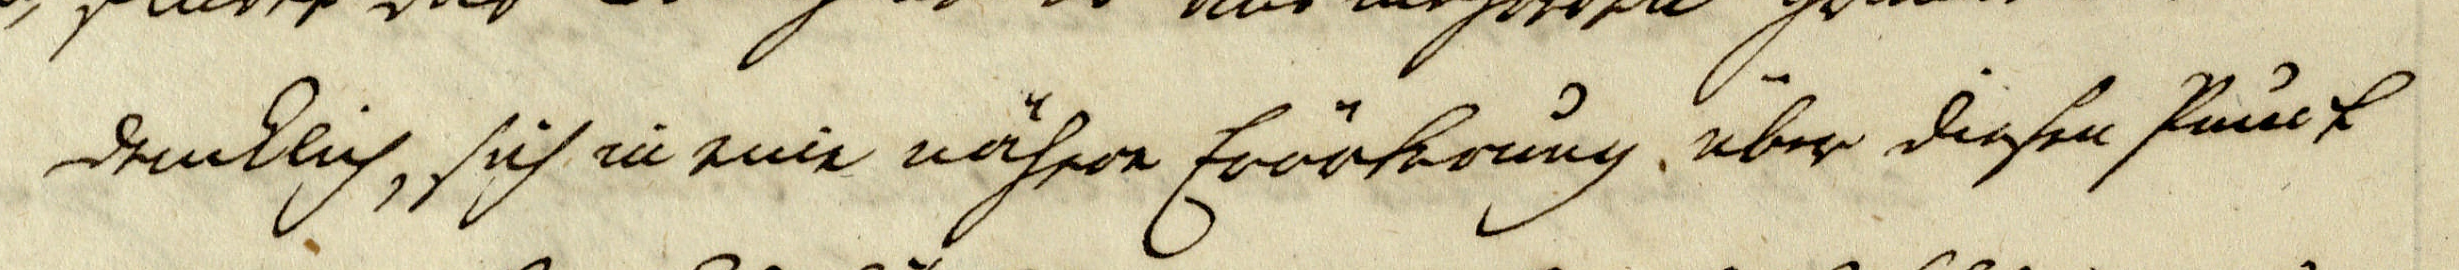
dencklich, sich in eine nähere Erörterung über diesen Punct
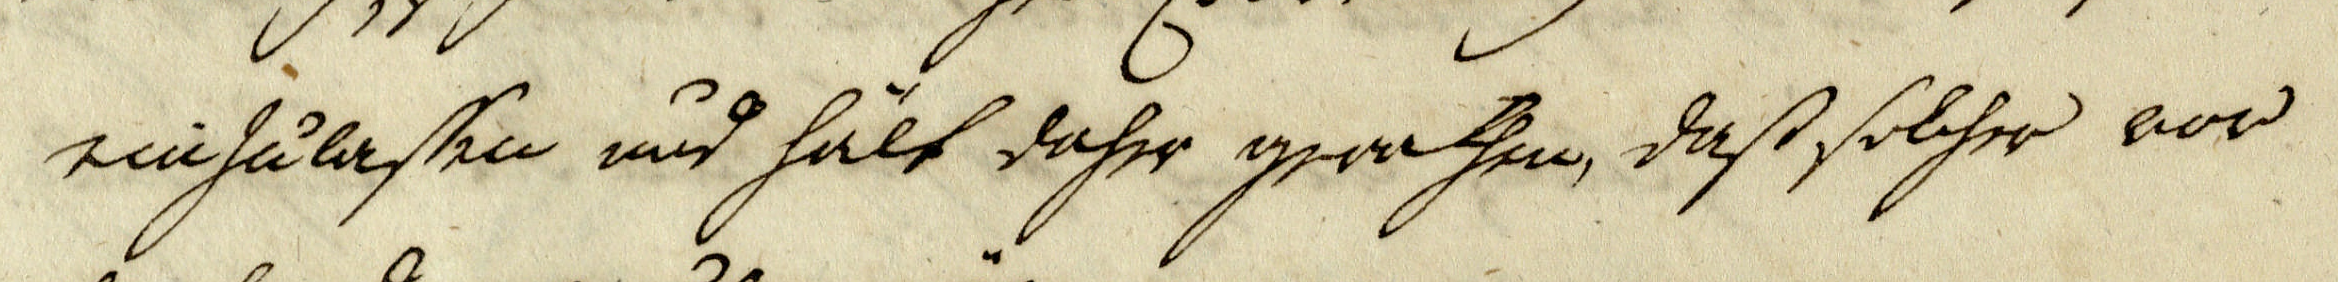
einzulassen und hält daher gerathen, daß solcher vor
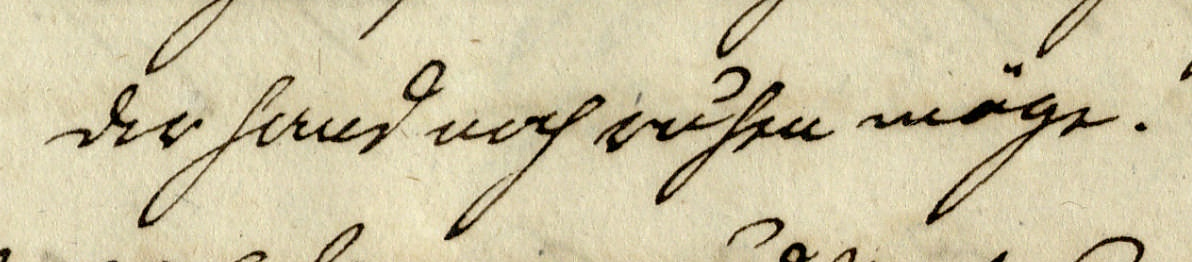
der Hand noch ruhen möge.
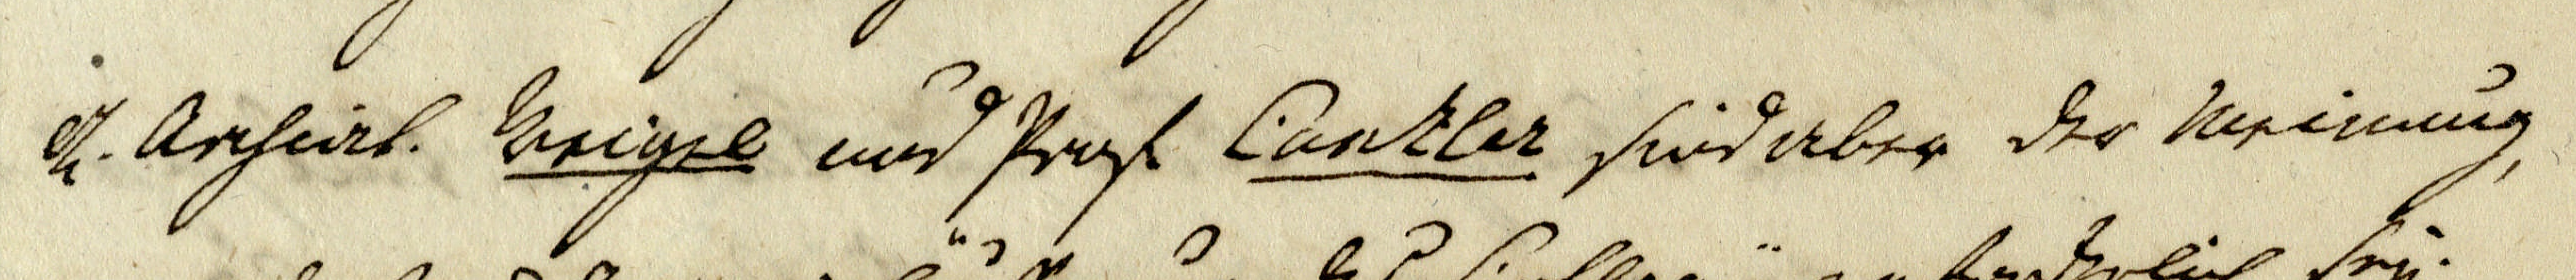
dh. Archiat. Weigel und Prof. Canzler sind aber der Meinung,
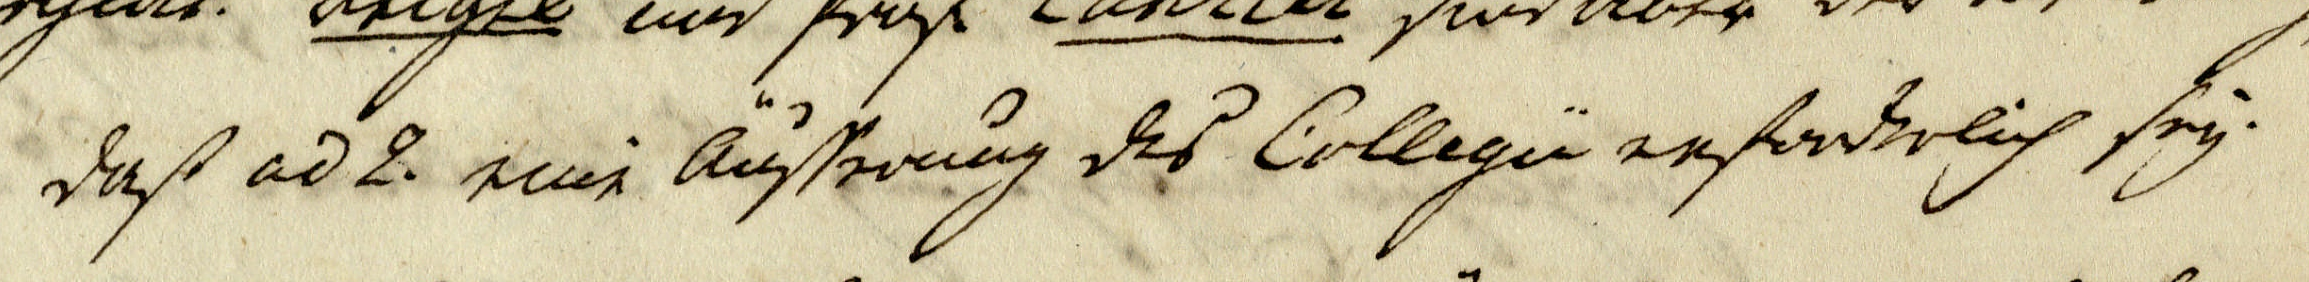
daß ad 2. eine Äusserung des Collegii erforderlich seÿ.
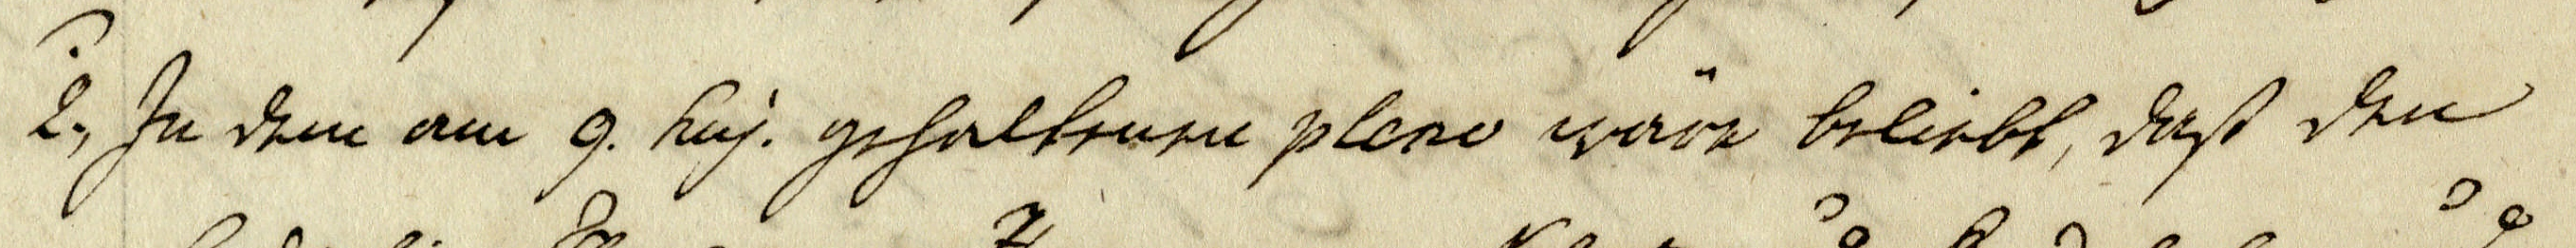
2. In dem am 9. huj. gehaltenen pleno wäre beliebt, daß den
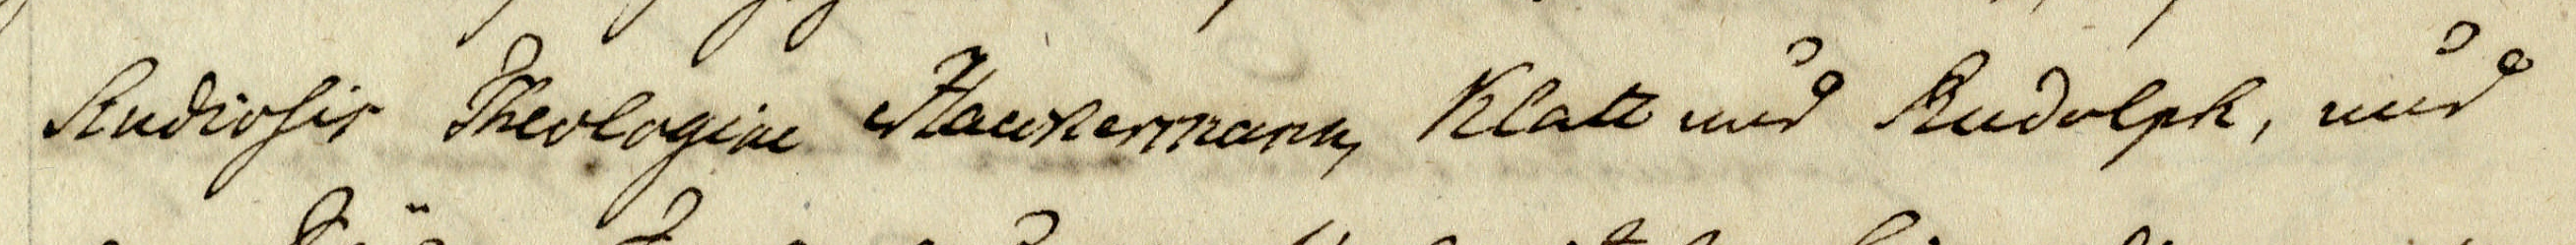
Studiosis Theologiae Haeckermann, Klatt und Rudolph, und
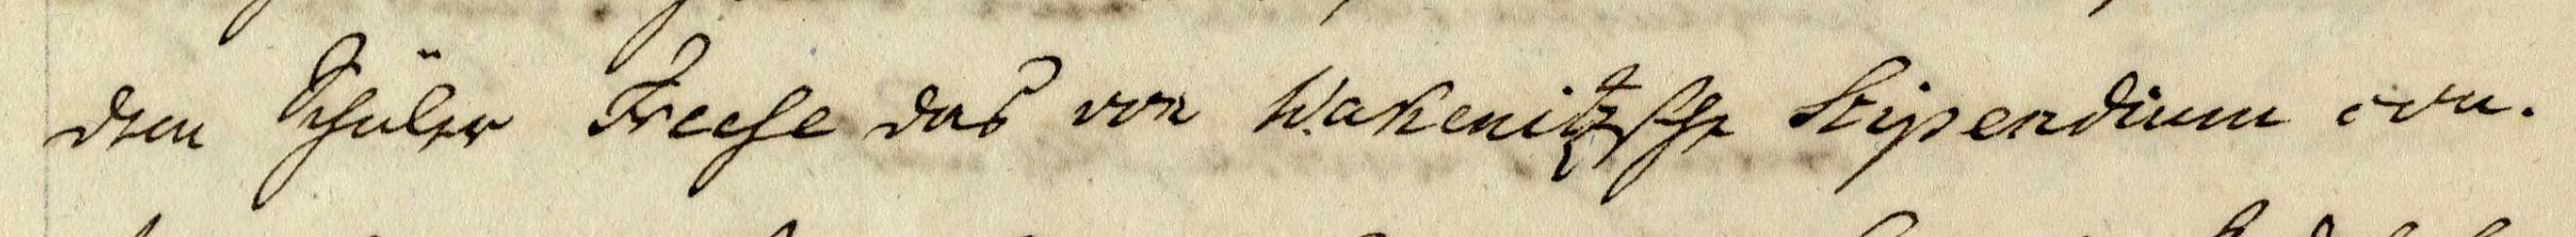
dem Schüler Freese das von Wakenitzsche Stipendium con¬
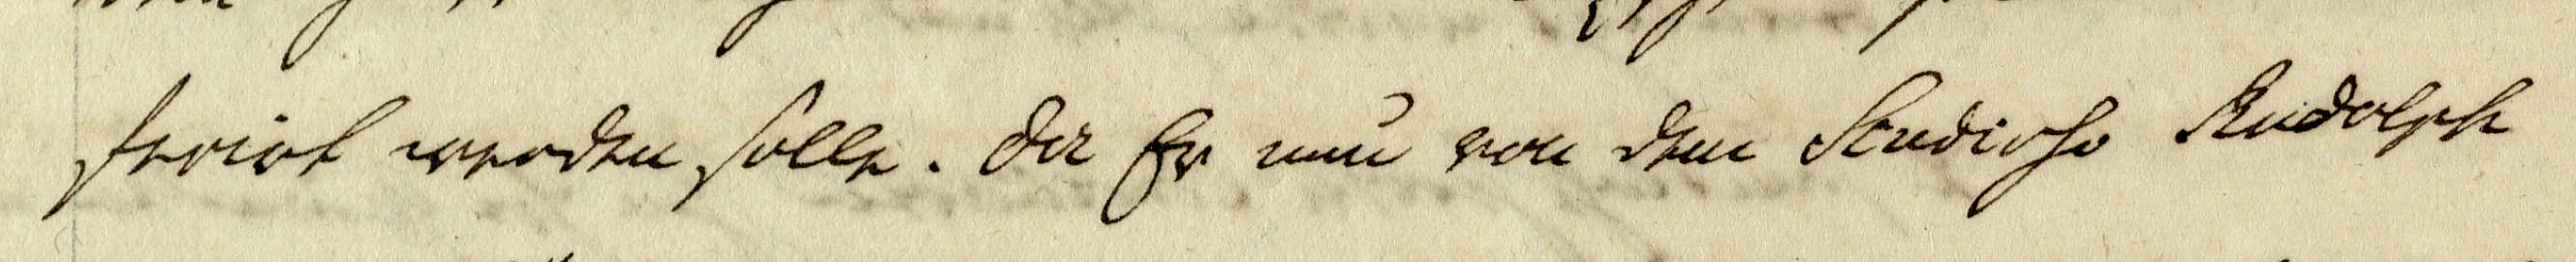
ferirt werden solle. Da Er nun von dem Studioso Rudolph
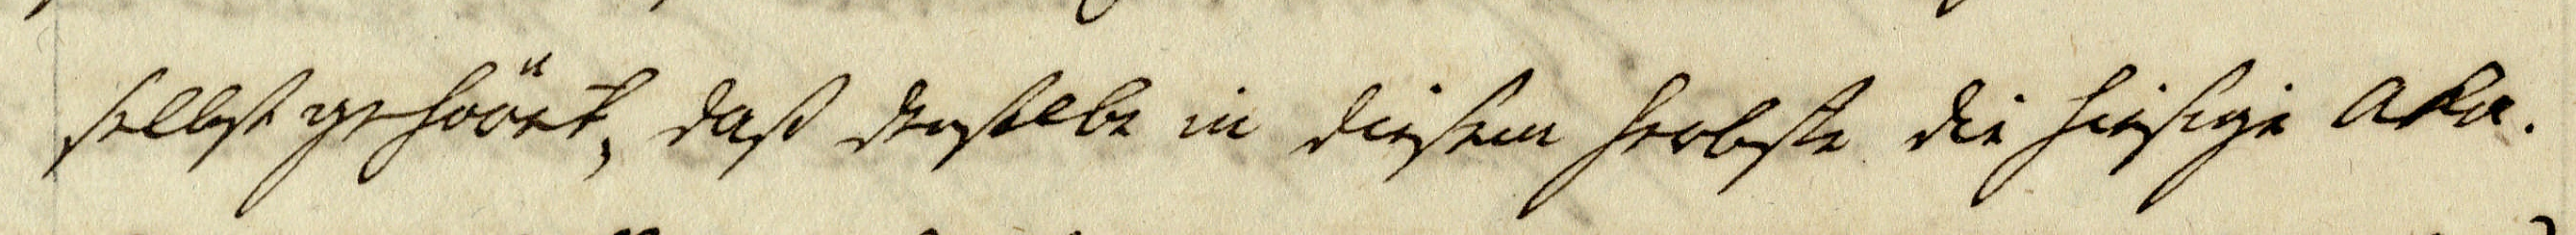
selbst gehöret, daß derselbe in diesem Herbste die hiesige Aka¬
